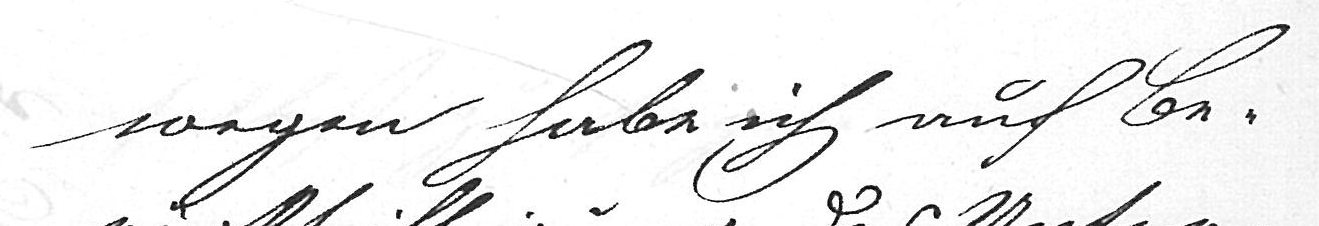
wegen habe ich auf Be-
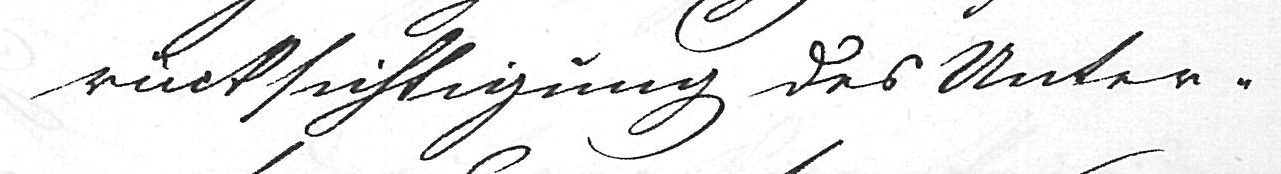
rücksichtigung des Unter-
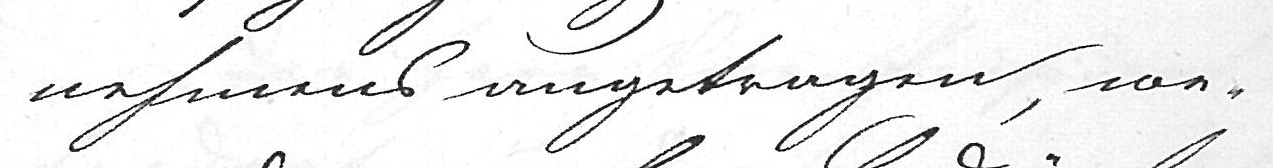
nehmens angetragen, we-
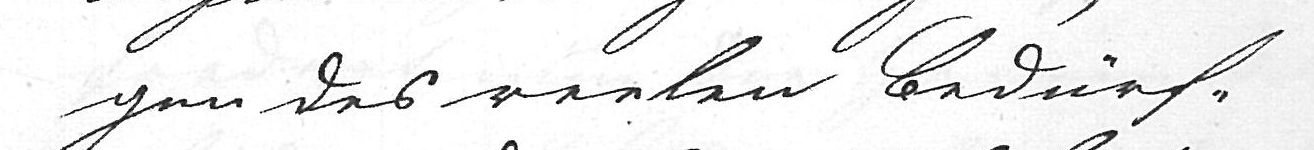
den des reelen Bedürf-
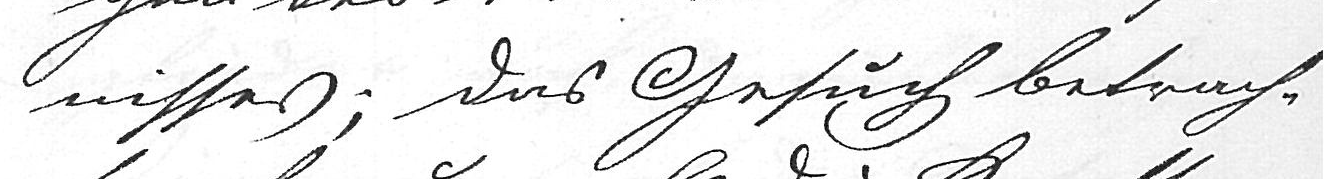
nisses; das Gesuch betrach-
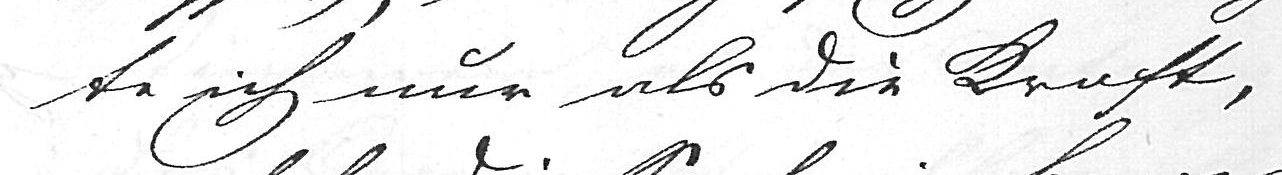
te ich nur als die Kraft,
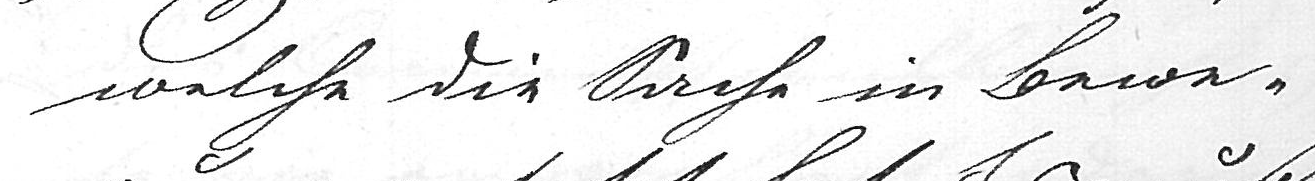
welche die Sache in Bewe-
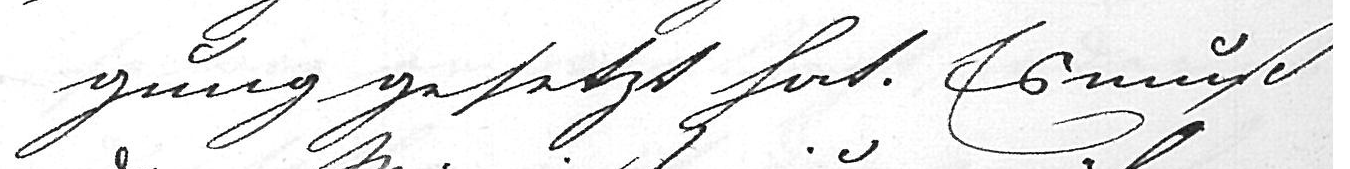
gung gesetzt hat. Es muß
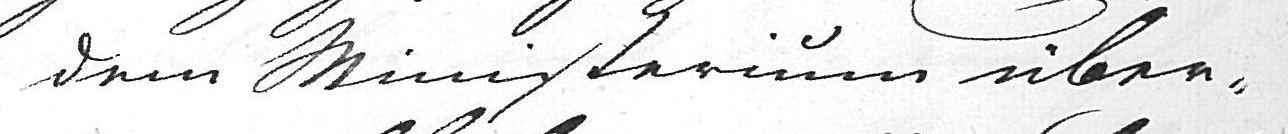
dem Ministerium über-
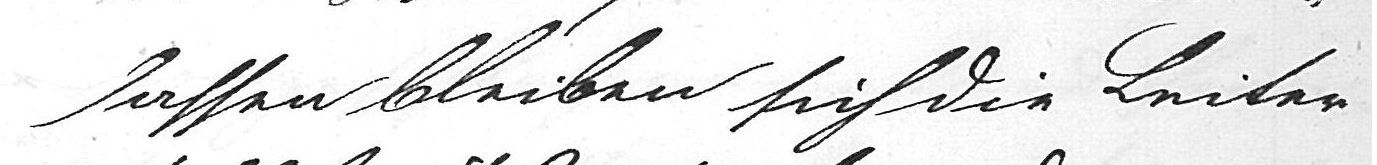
lassen bleiben sich die Leiter
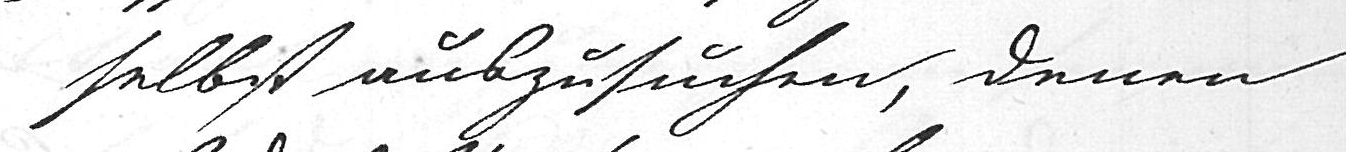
selbst, auszusuchen, denen
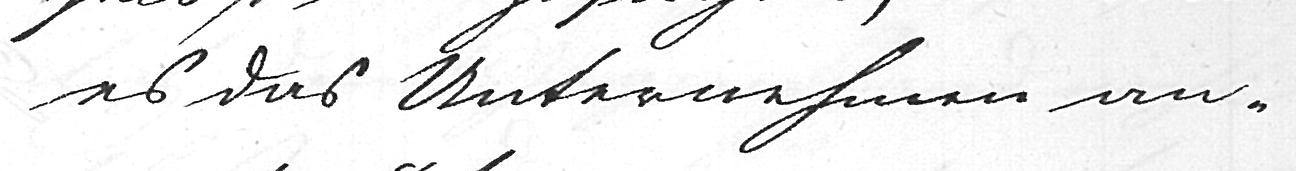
es das Unternehmen an-
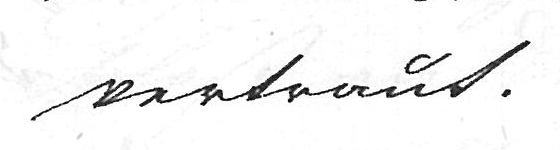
vertraut.
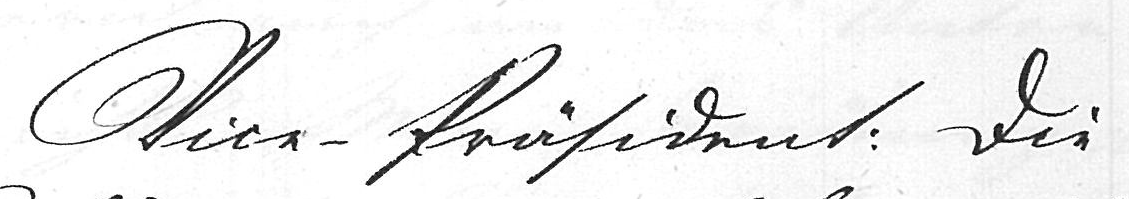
Vice-Präsident: Die
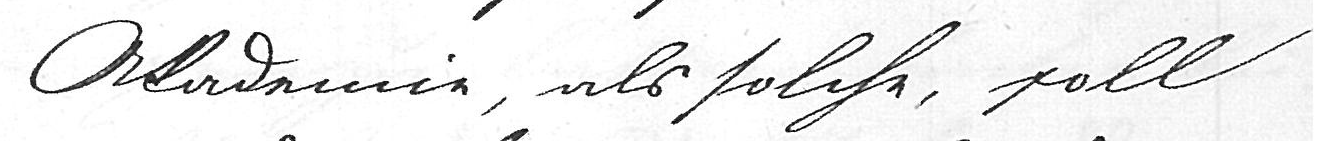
Akademie, als solche, soll
